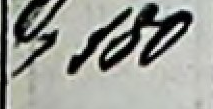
0,180
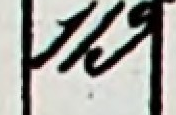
113
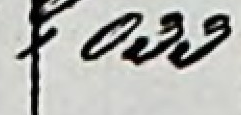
0,033
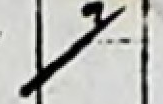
7
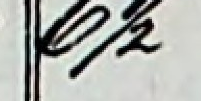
6 ½
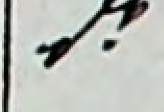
do
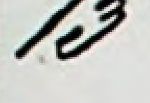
13
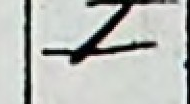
I
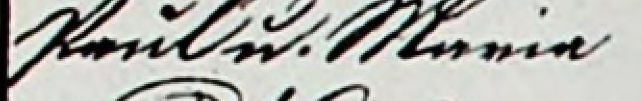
Paul u. Maria
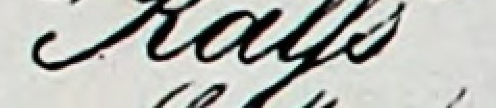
Kalss
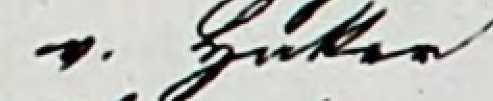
v. Haker
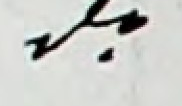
do
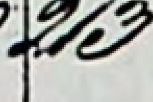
213
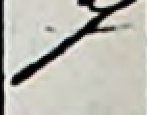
7
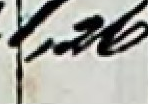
1,26
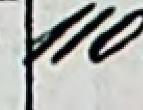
110
